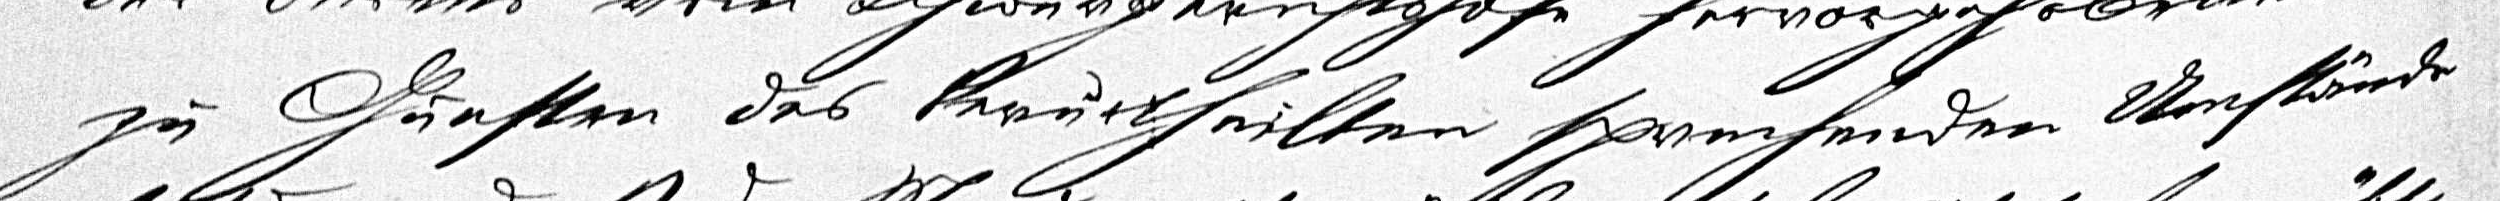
zu Gunsten des Verurtheilten sprechenden Umstände
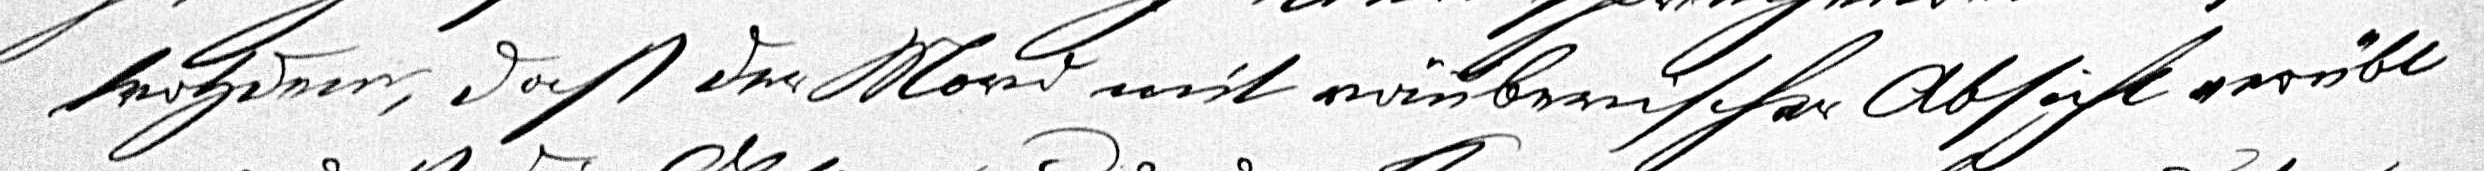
trotzdem, daß der Mord mit räuberischer Absicht verübt
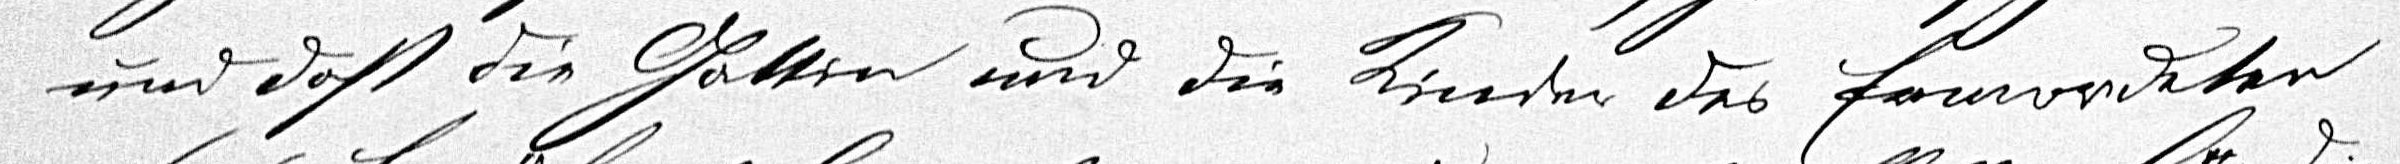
und daß die Gattin und die Kinder des Ermordeten
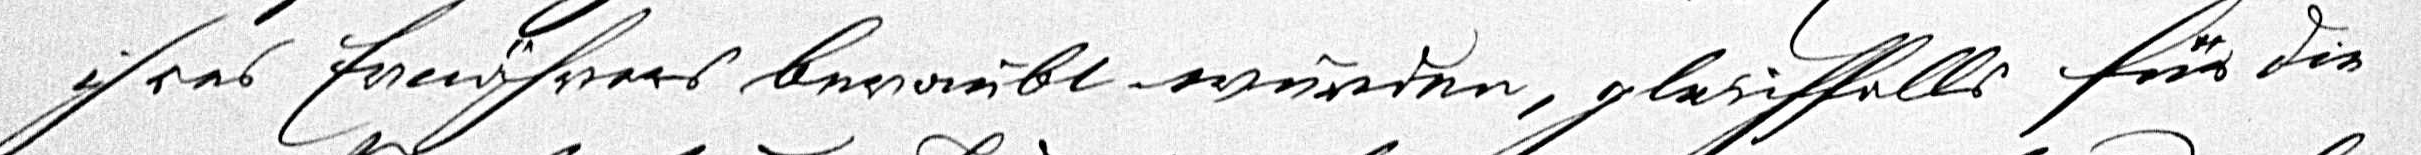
ihres Ernährens beraubt wurden, gleichfalls für die
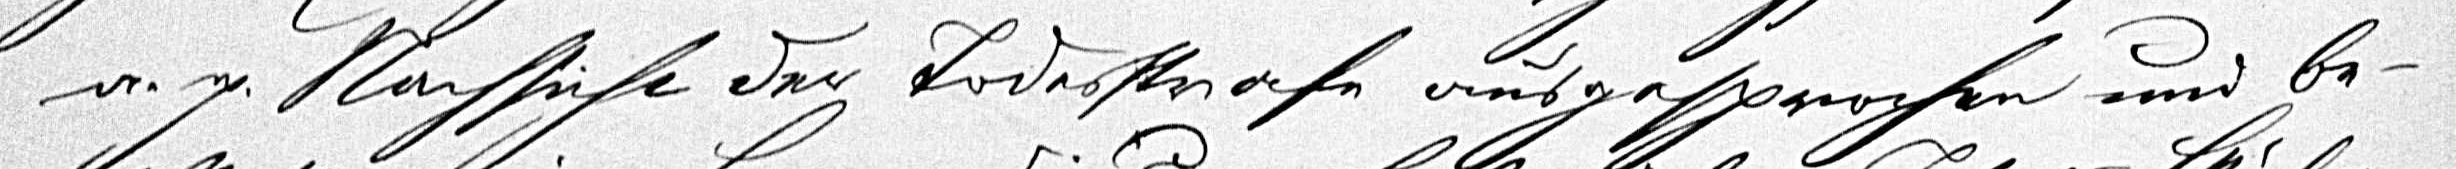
a.g. Nachsicht der Todesstrafe ausgesprochen und be¬
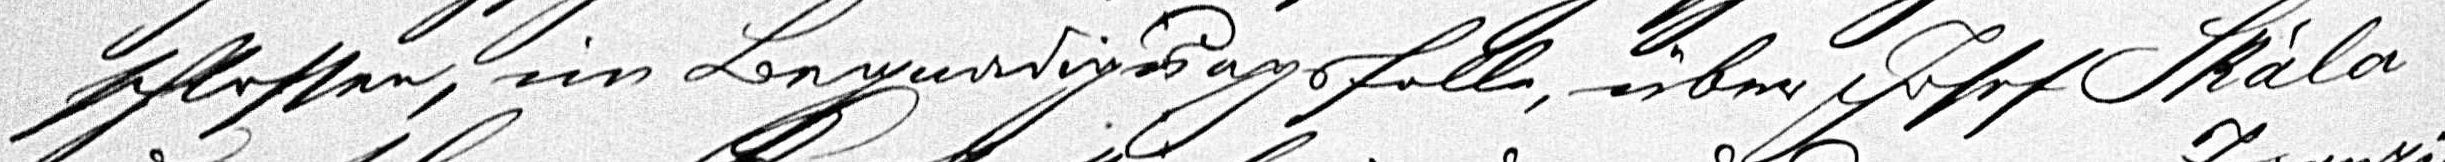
schlossen, im Begnadigungshalle, über Josef Skála
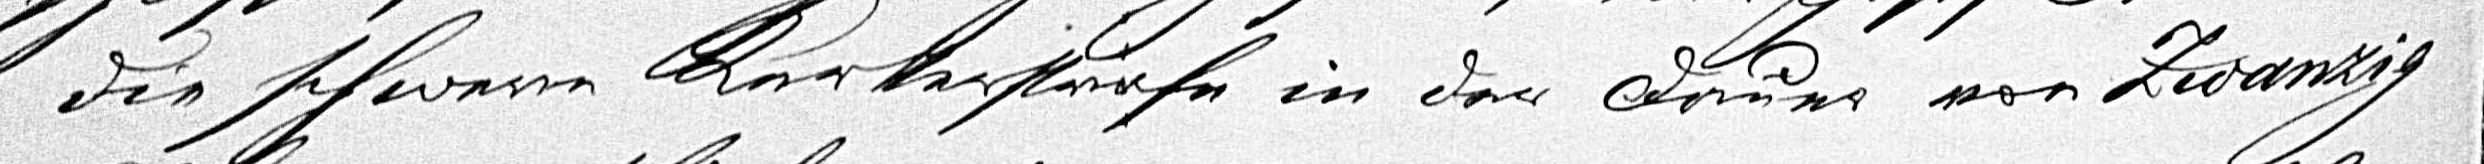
die schwere Kerkerstrafe in der Dauer von Zwanzig
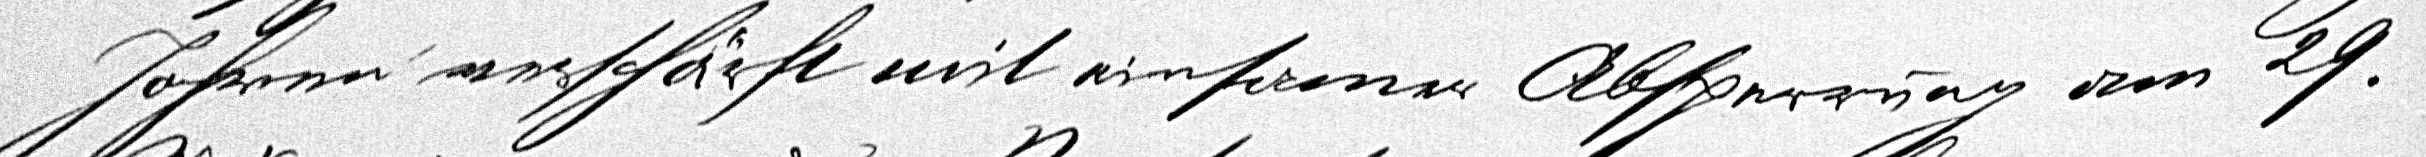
Jahren verschärft mit einsamer Absperrung am 29.
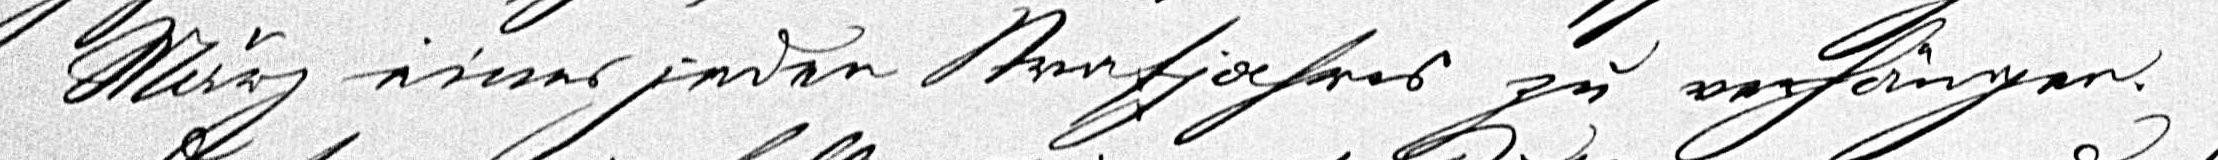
März eines jeden Strafjahres zu verhängen.
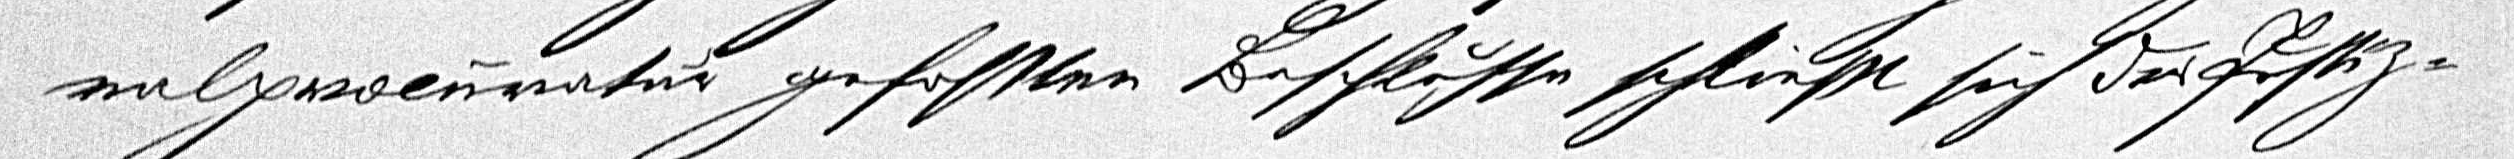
ralprocuratur gefaßten Beschluße schließt sich der Justiz¬
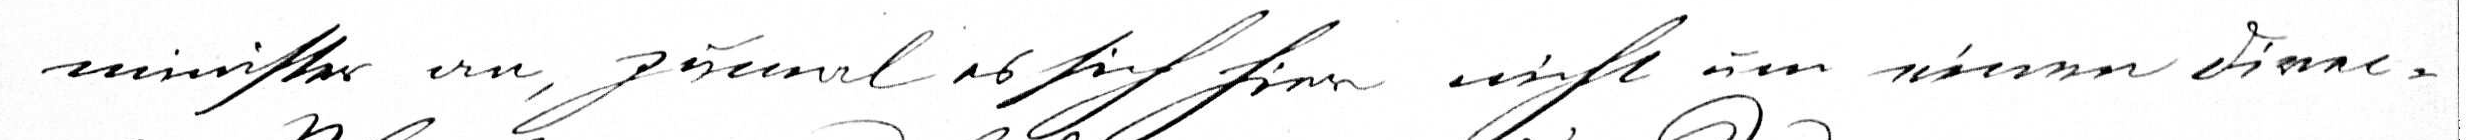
minister an, zumal es sich hier nicht um einen direc¬
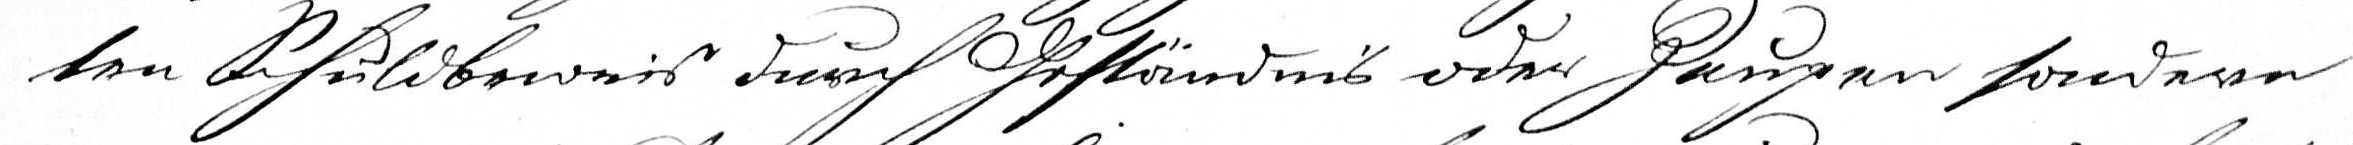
ten Schuldbeweis durch Geständnis oder Zeugen sondern
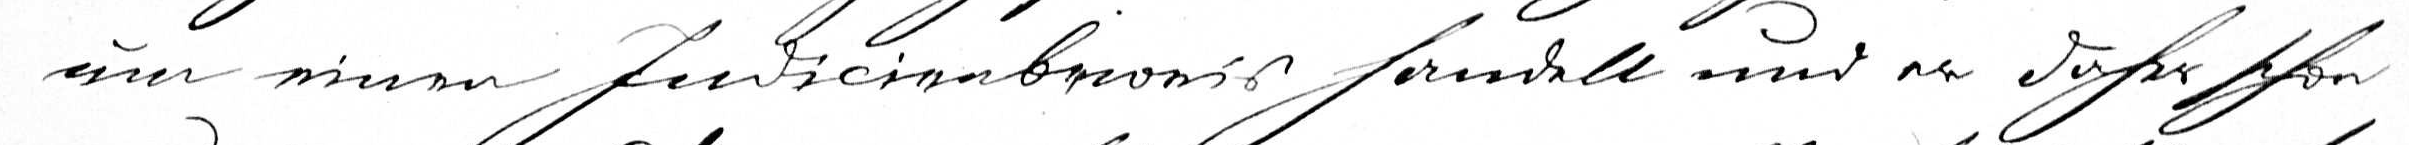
um einen Indicienbeweis handelt und er daher schon
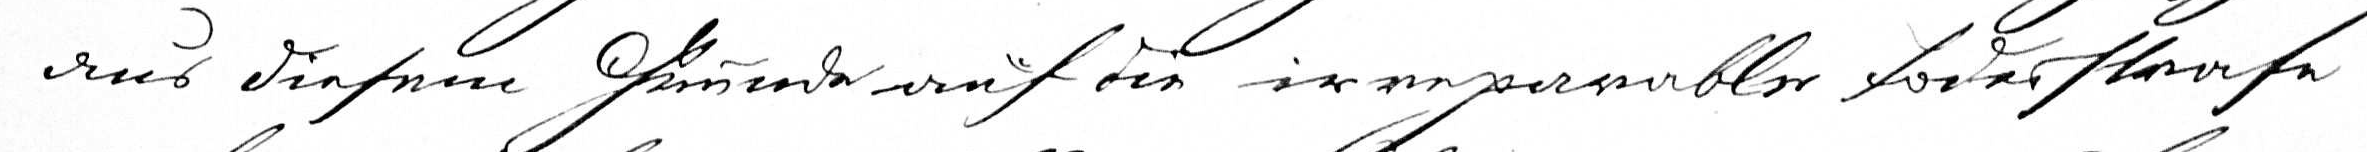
aus diesem Grunde auf die irreparable Todesstrafe
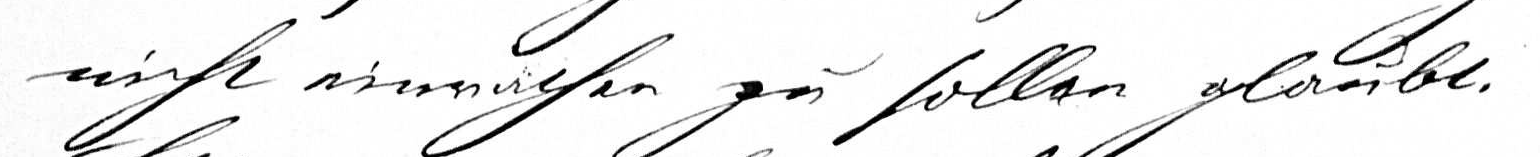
nicht einräthen zu sollen glaubt.
